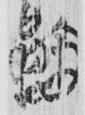鮑
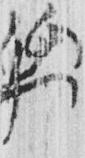叔
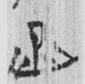○（牙）
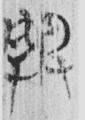與
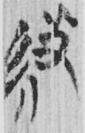級（隰）
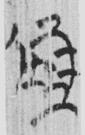○（朋）
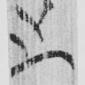之
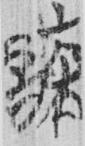諫
